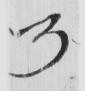乃
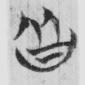皆
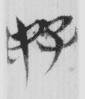好
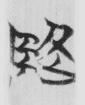{阩止}
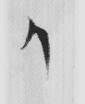人
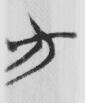方
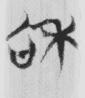和
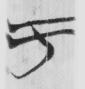于
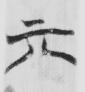亓
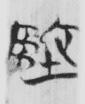地
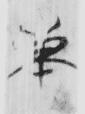東
